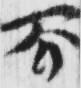而
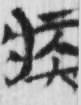疾
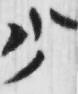少
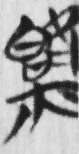○（氣）
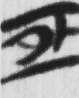亙（恆）
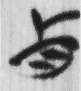貞
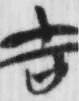吉
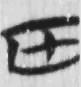甲
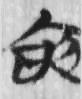寅
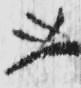之
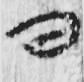日
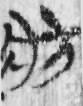○（病）
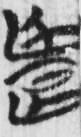良
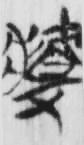○（瘥）
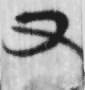又
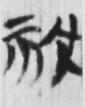○（太）
